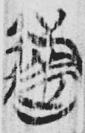○（失）
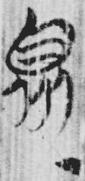衆
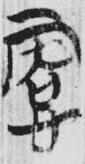○（猛）
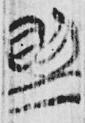則（則）
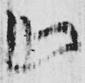亡
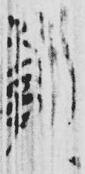○（親）
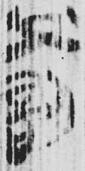罰
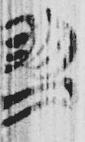則（則）
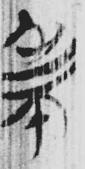民
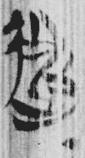逃
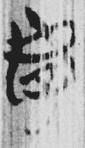好
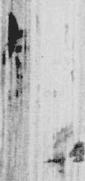型（刑）
